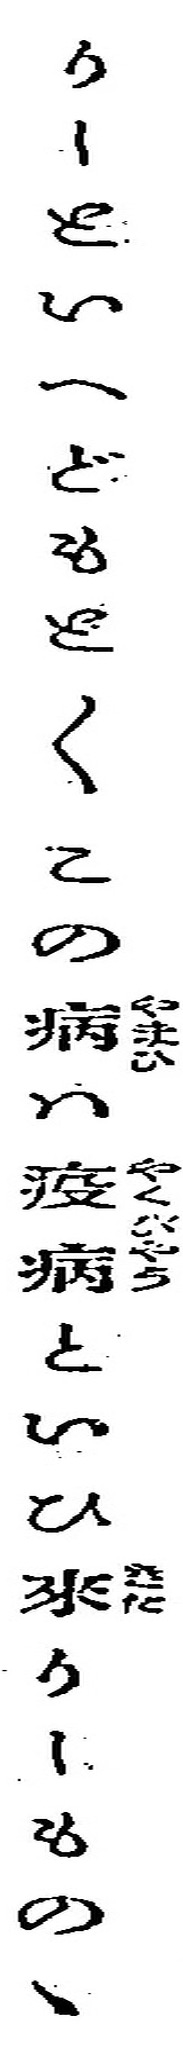りしといへどおと〳〵この病は疫病といひ來りしものゝ
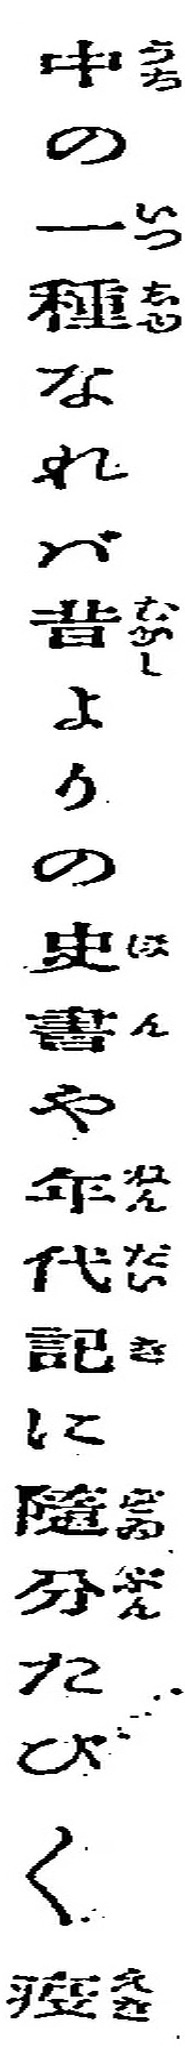中の一種なれば昔よりの史書や年代記に随分たび〳〵疫
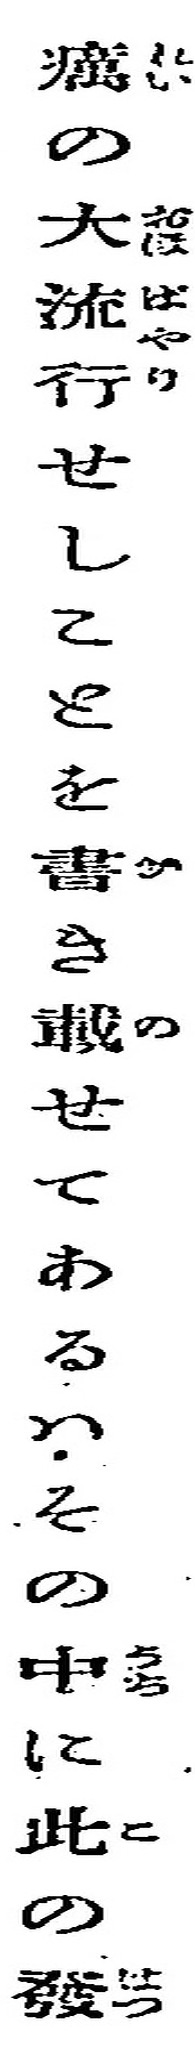癘の大流行せしことを書き載せてあるはその中に此の發
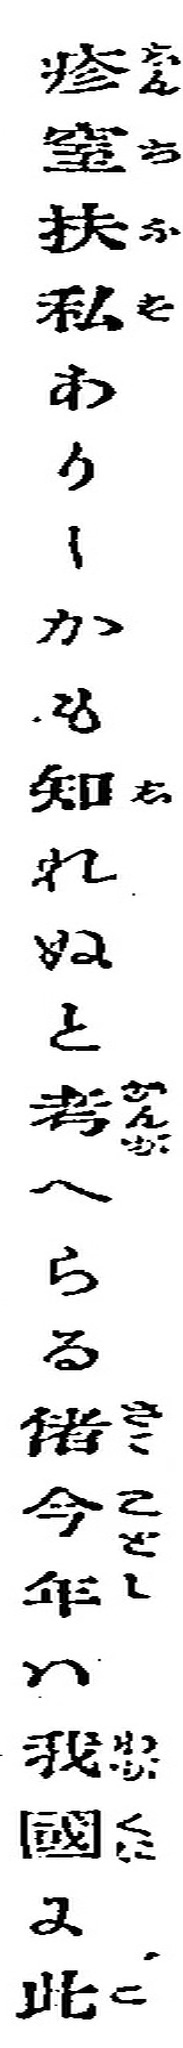疹窒扶私ありしかも知れぬと考へらる偖今年は我國に此
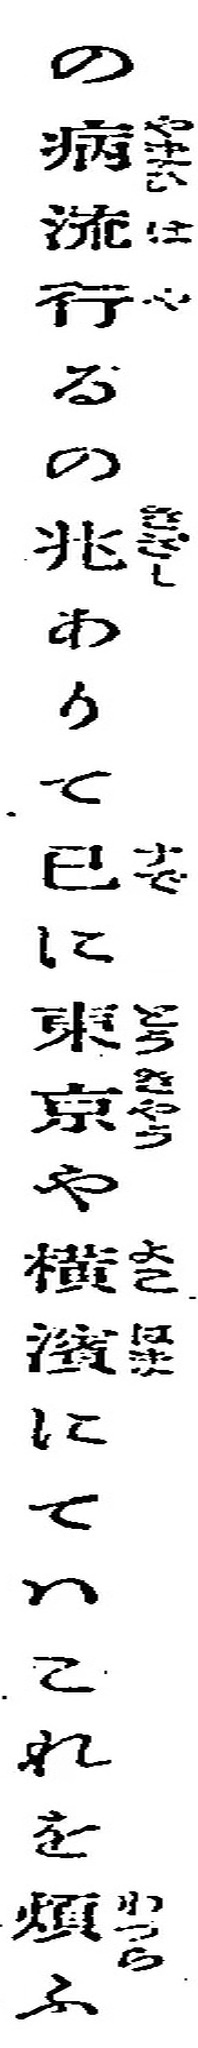の病流行るの兆ありて已に東京や横濱にてはこれを煩ふ
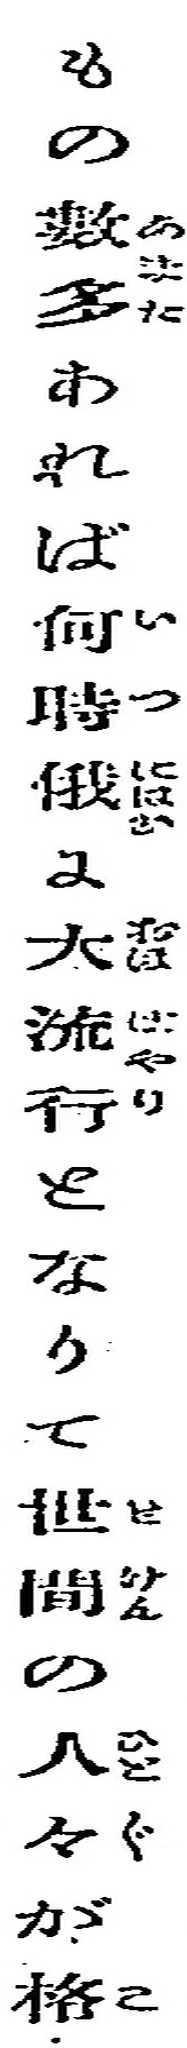もの數多あれば何時俄に大流行となりて世間の人々が格
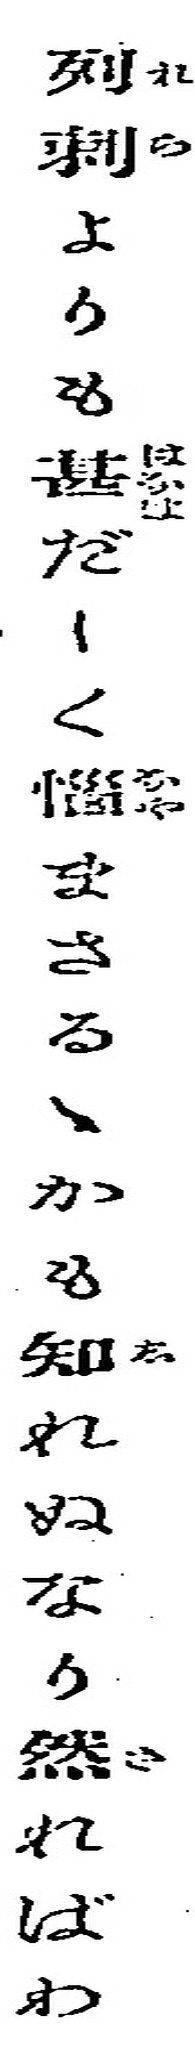列刺よりも甚だしく悩まさるゝかも知れぬなり然ればわ

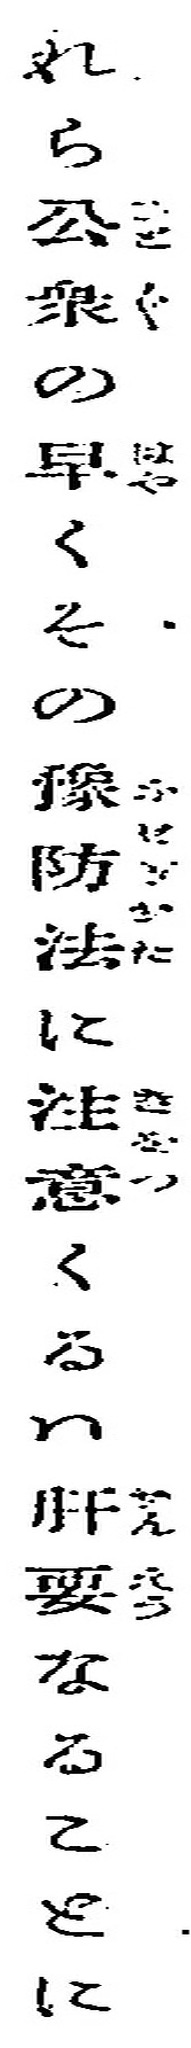れら公衆の早くその豫防法に注意くるは肝要なることに
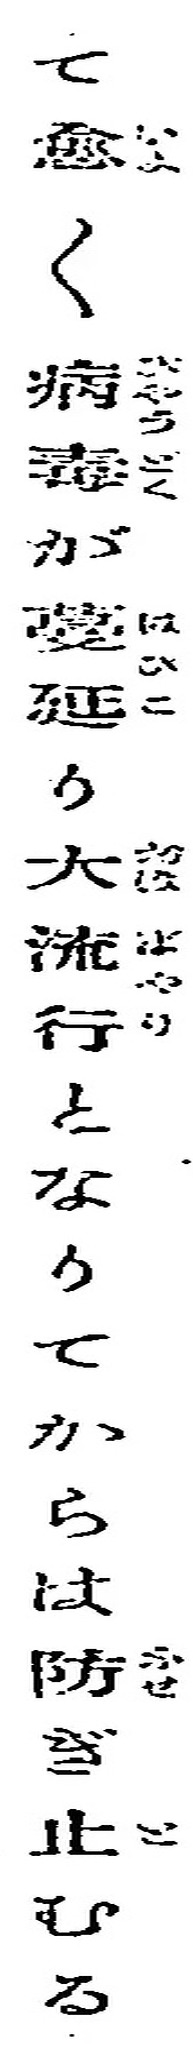て愈〳〵病毒が蔓延り大流行となりてからは防ぎ止むる
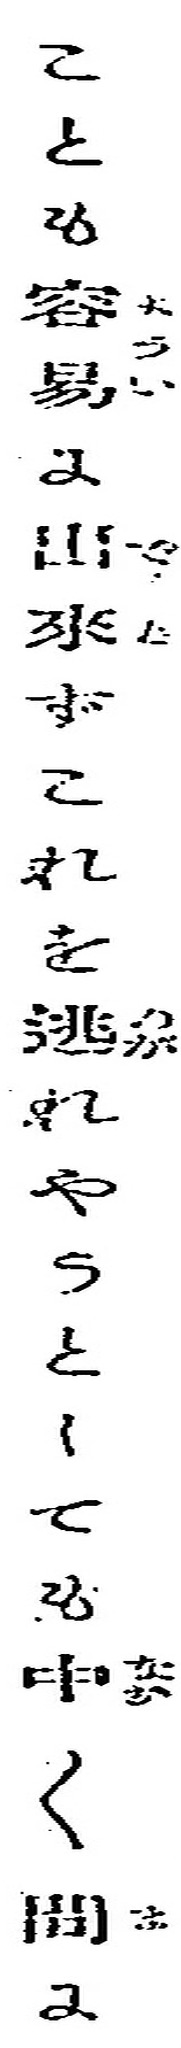ことも容易に出來ずこれを逃れやうとしても中〳〵間に
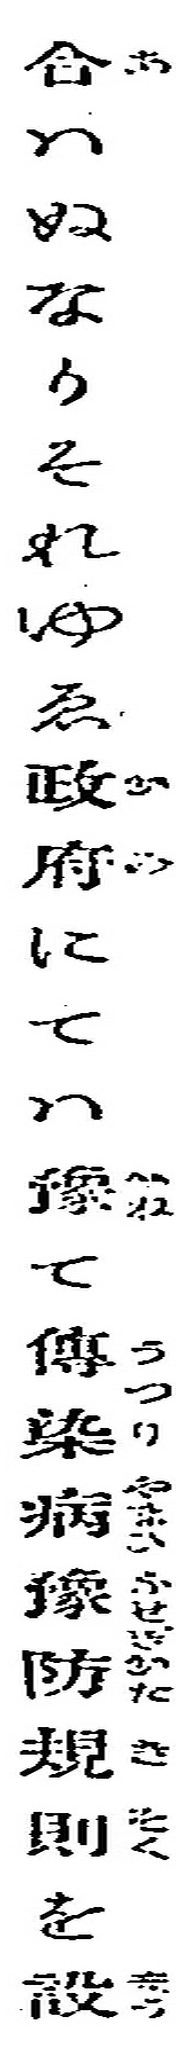合はぬなりそれゆゑ政府にては豫て傅染病豫防規則を設
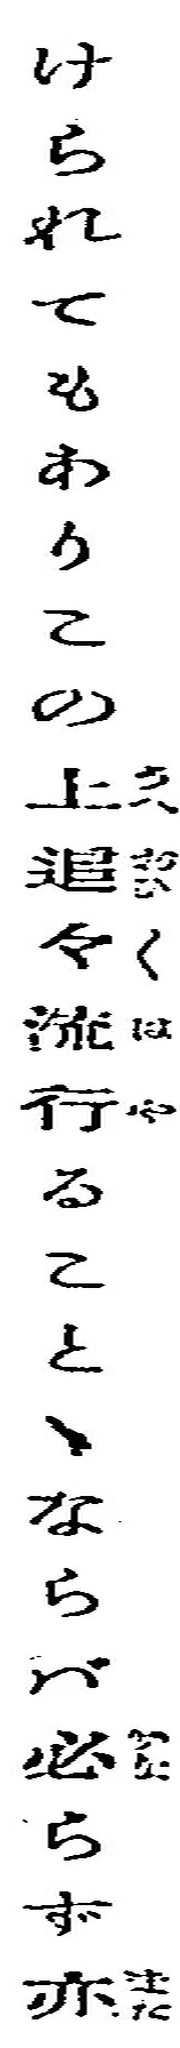けられてもありこの上追々流行ることゝならば必らず亦
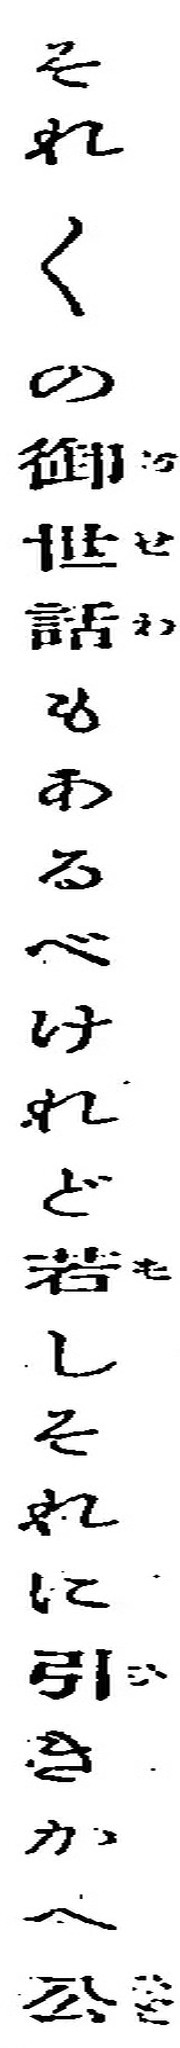それ〳〵の御世話もあるべけれど若しそれに引きかへ公
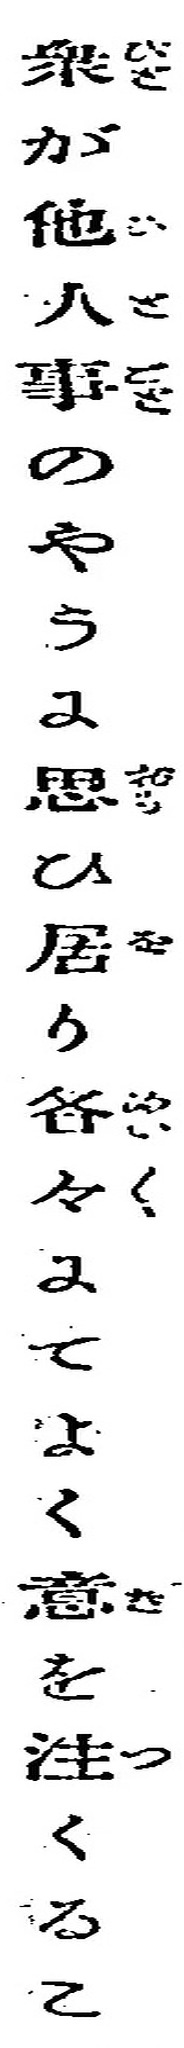衆が他人事のやうに思ひ居り各々にてよく意を注くるこ
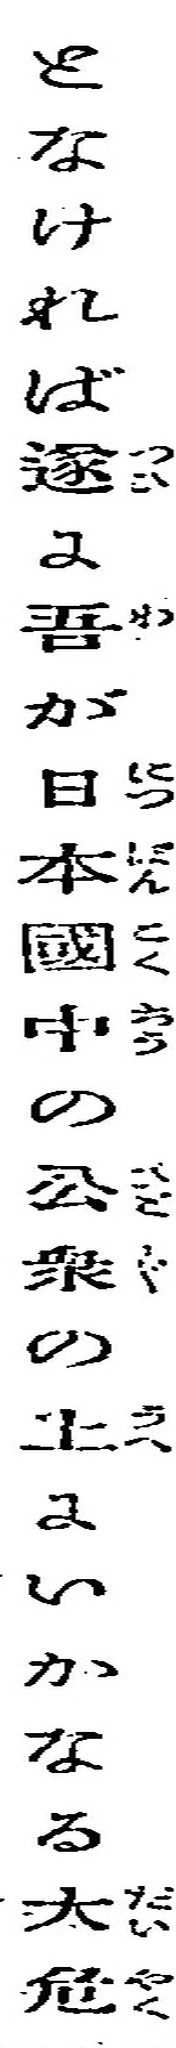となければ遂に吾が日本國中の公衆の上にいかんる大危
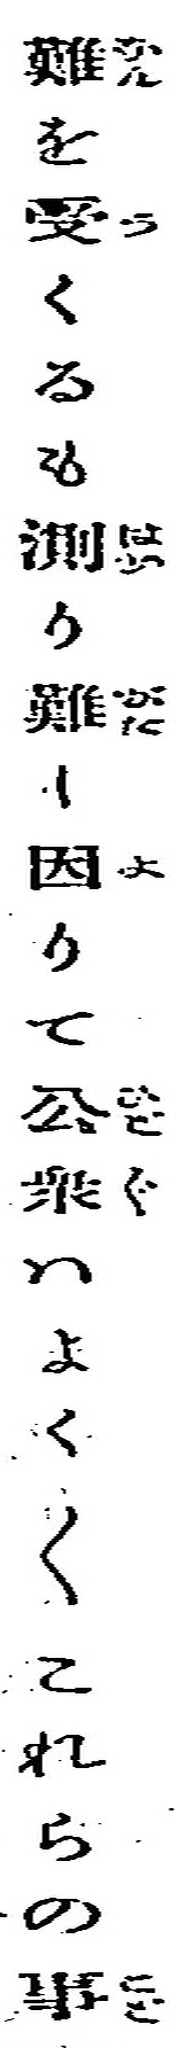難を受くるも測り難し因りて公衆はよく〳〵これらの事
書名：発疹窒扶私予防の訓
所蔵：国立国会図書館 National Diet Library, JAPAN
